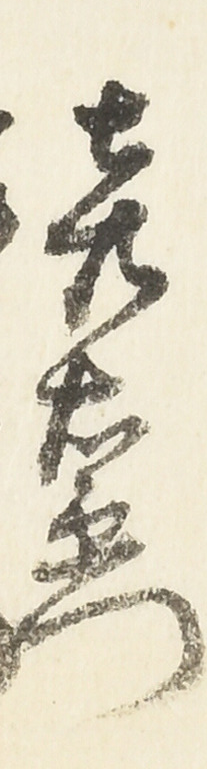同二酉年喜右衛門
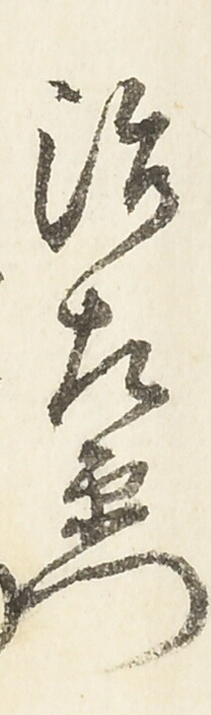治左衛門
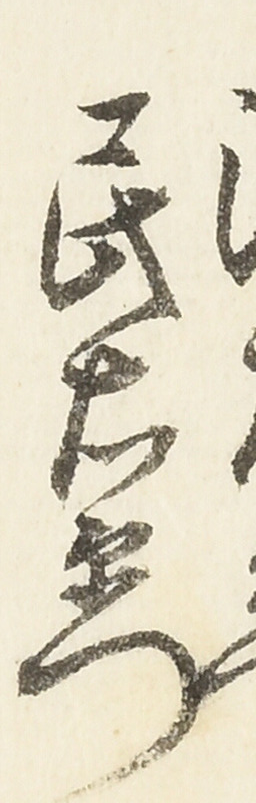民右衛門
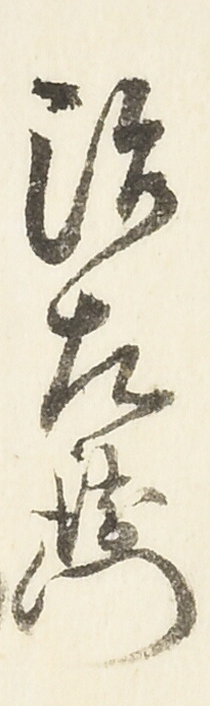治左衛門
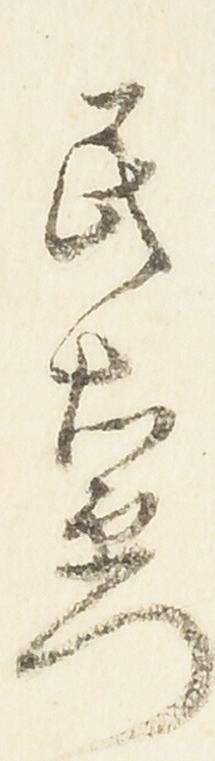民右衛門
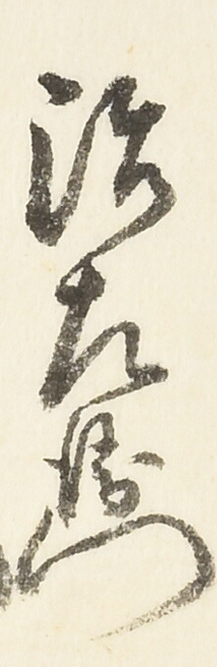治左衛門
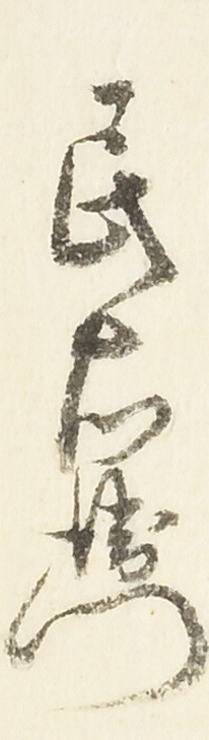民右衛門
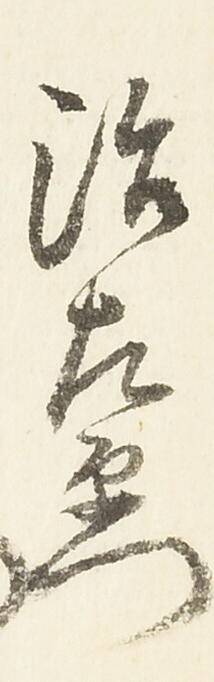治左衛門
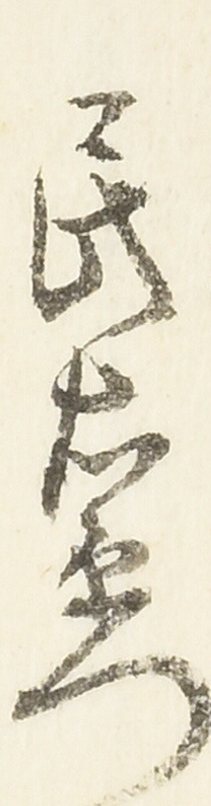民右衛門
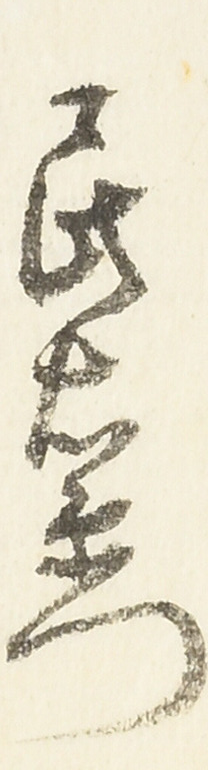民右衛門
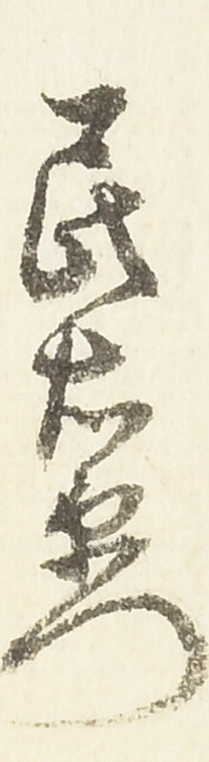民右衛門
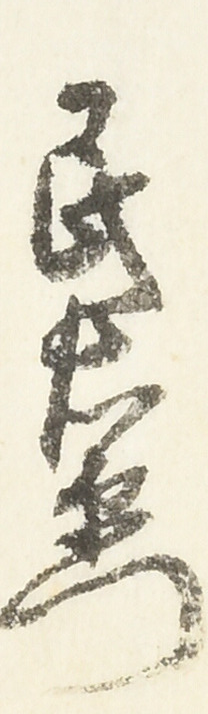民右衛門
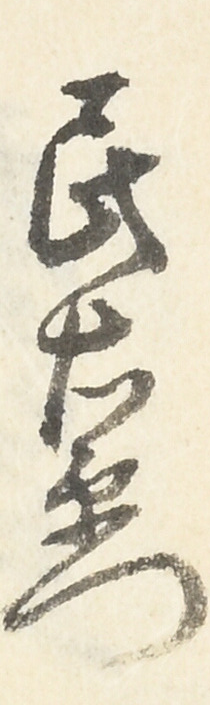民右衛門
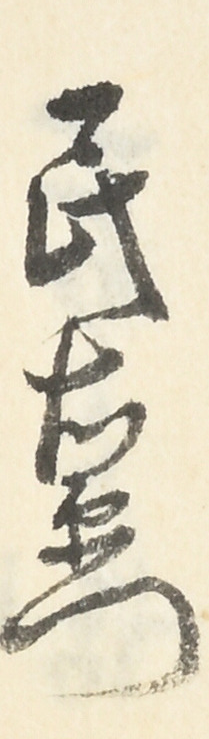民右衛門
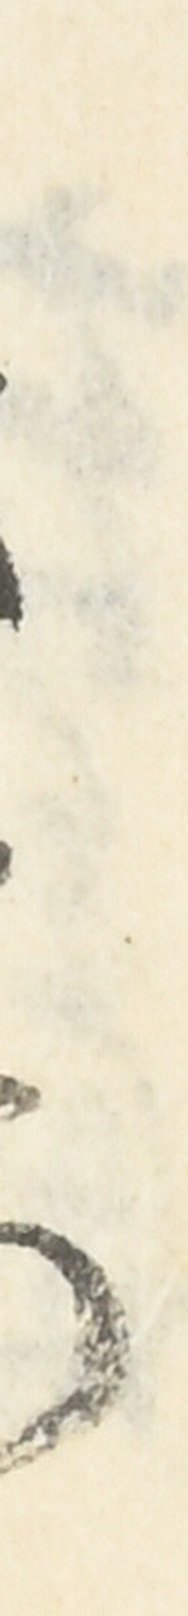民右衛門

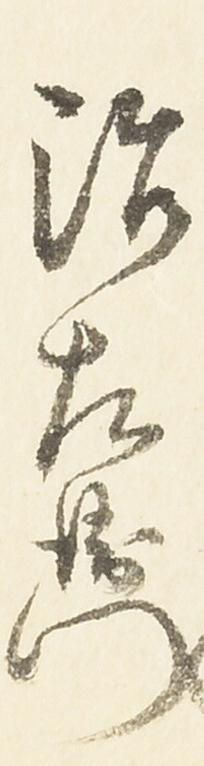治左衛門
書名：鉾持町丁代勤役年歴順控
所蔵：伊那市立高遠町図書館・合同会社AMANE
